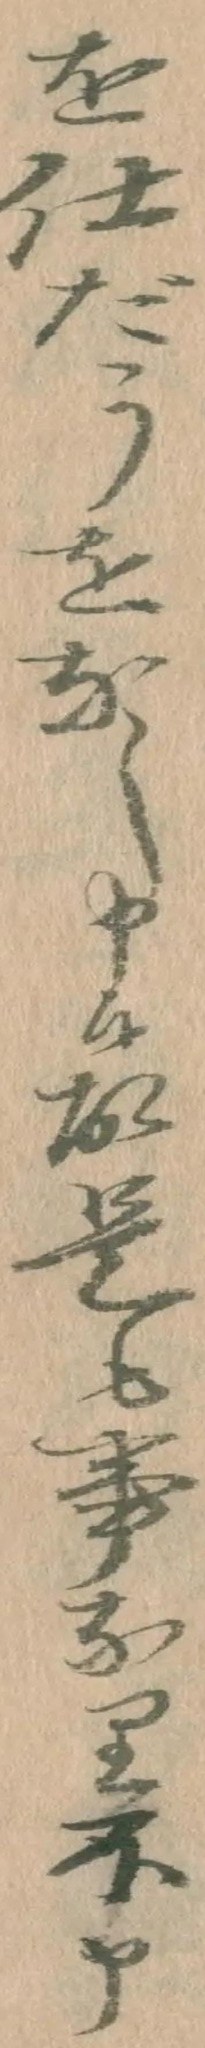を仕だうをなし申候故是も事な里不申
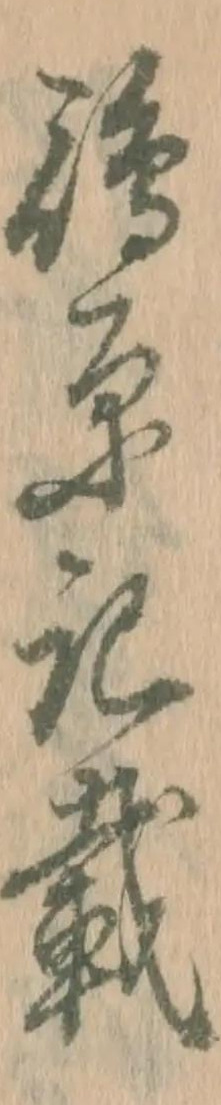島原記載
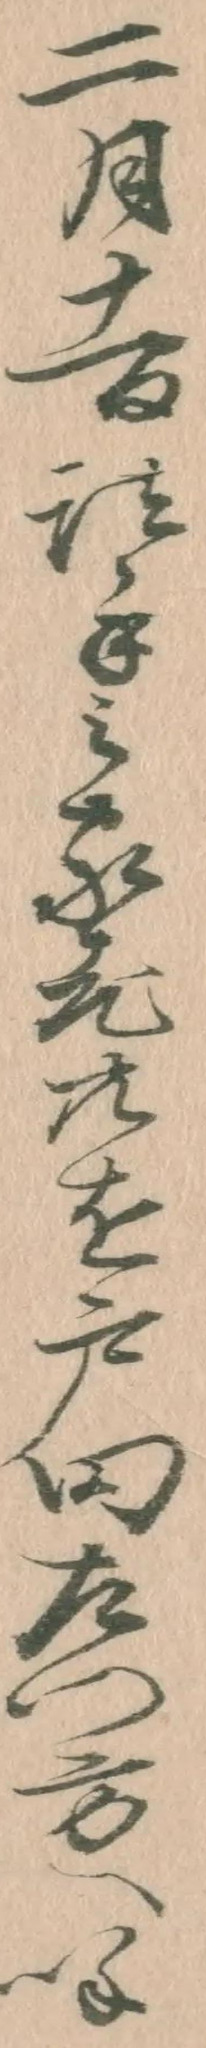二月十一日諸手之家老共を戸田左門方へ呼
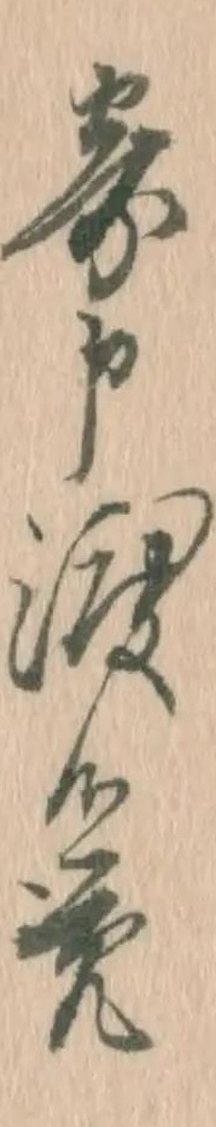寄申渡候覚
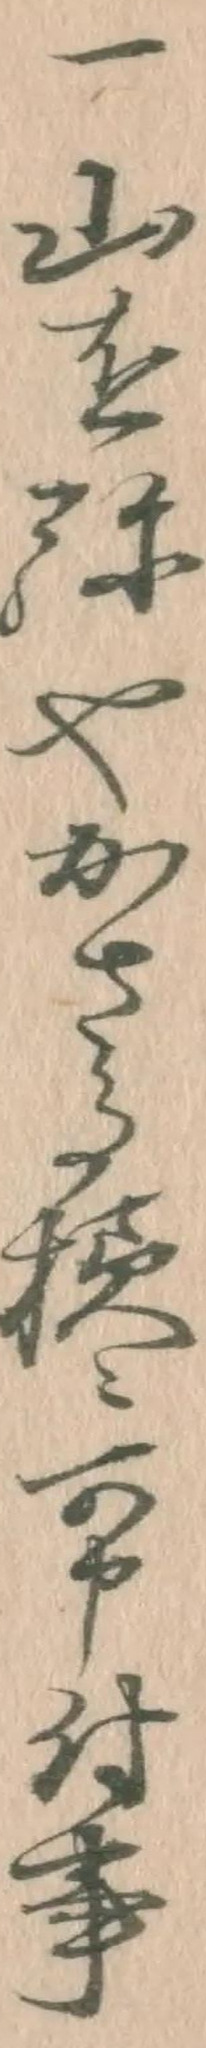一山を弥やかさる様に可申付事
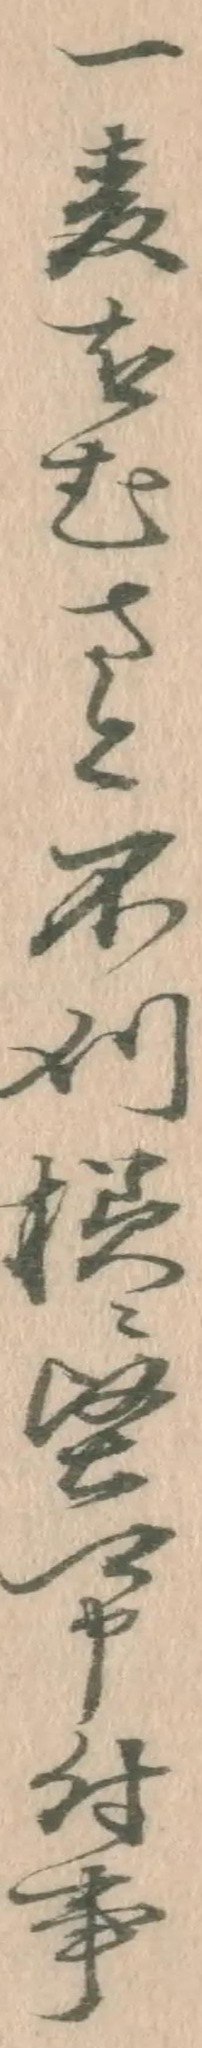一麦をむさと不刈様に堅可申付事
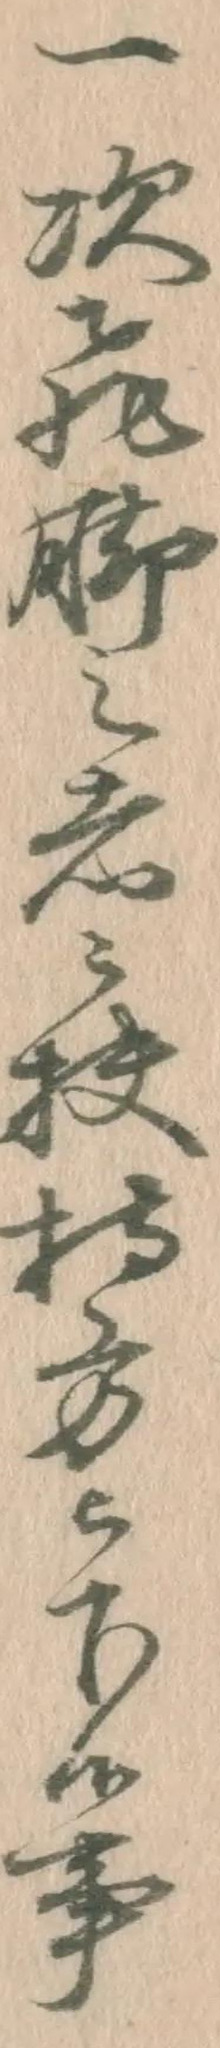一次飛脚之者に扶持方被下候事
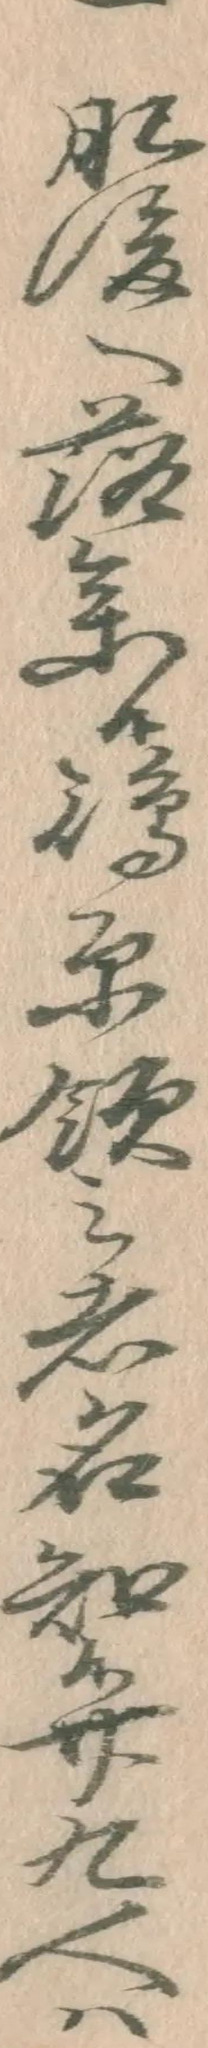一肥後へ落参候島原領之者名知候廿九人は
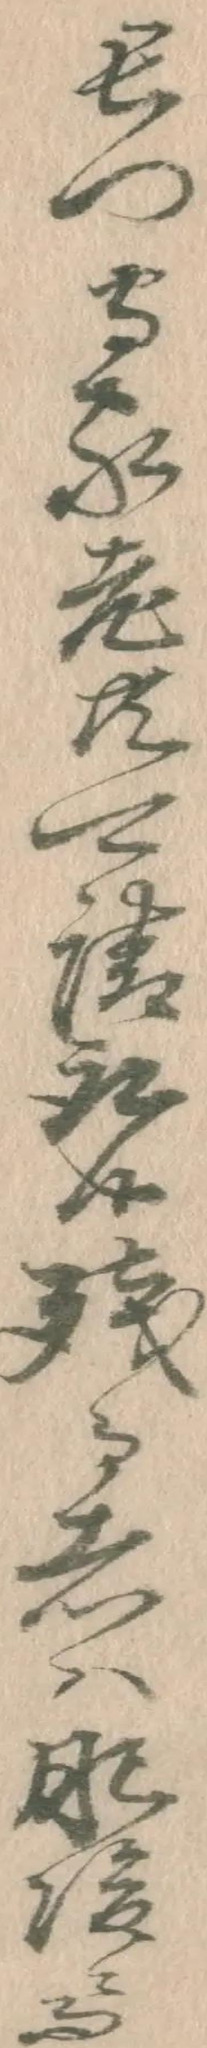長門守家老共可請取候残る者は肥後に而
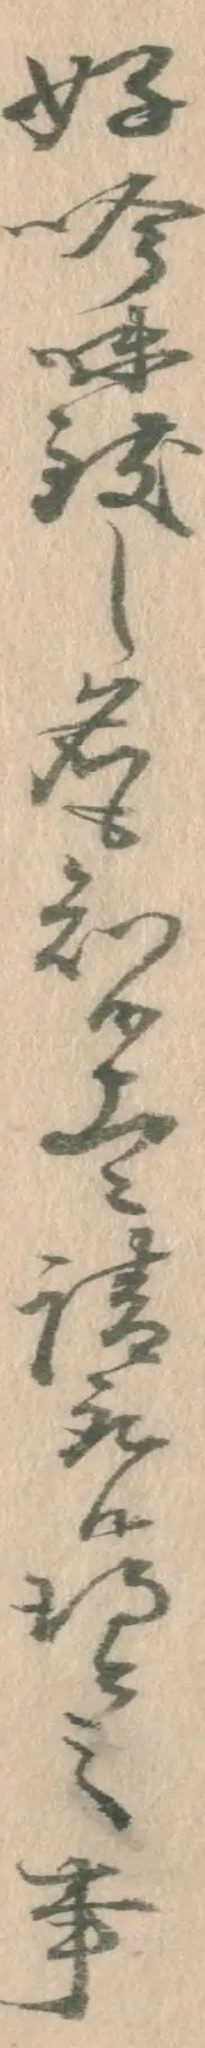好吟味致し名も知候上に請取候得と之事
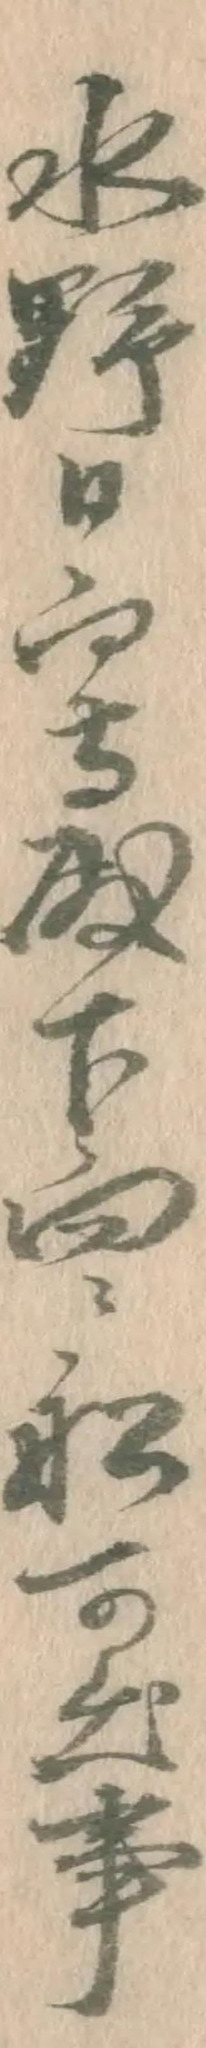一水野日向守殿下向に舩可出事
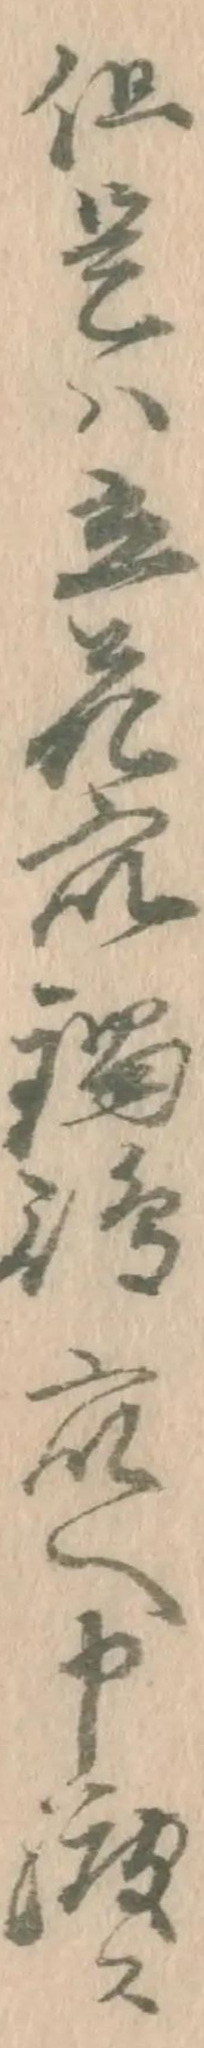但是は立花衆鍋島衆へ申渡す

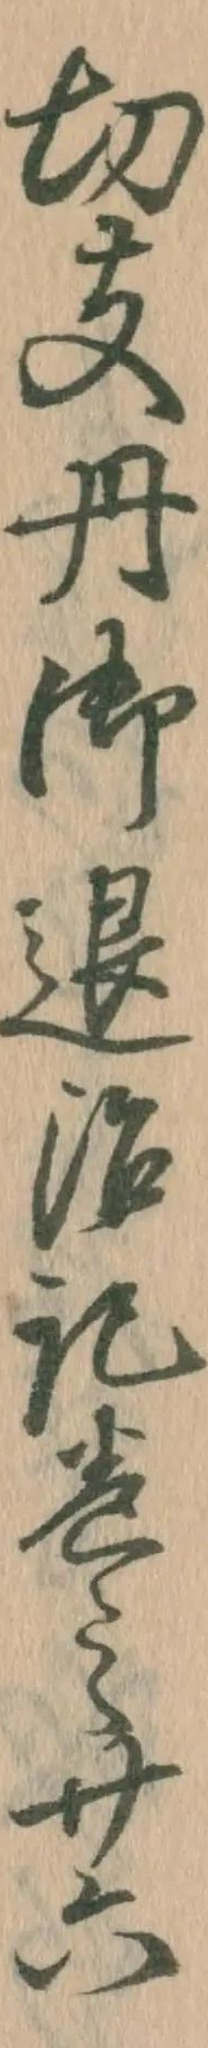切支丹御退治記巻之廿六
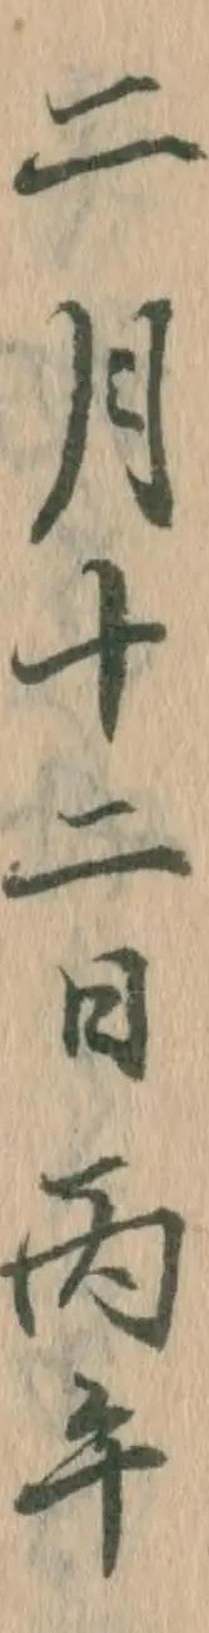二月十二日丙午
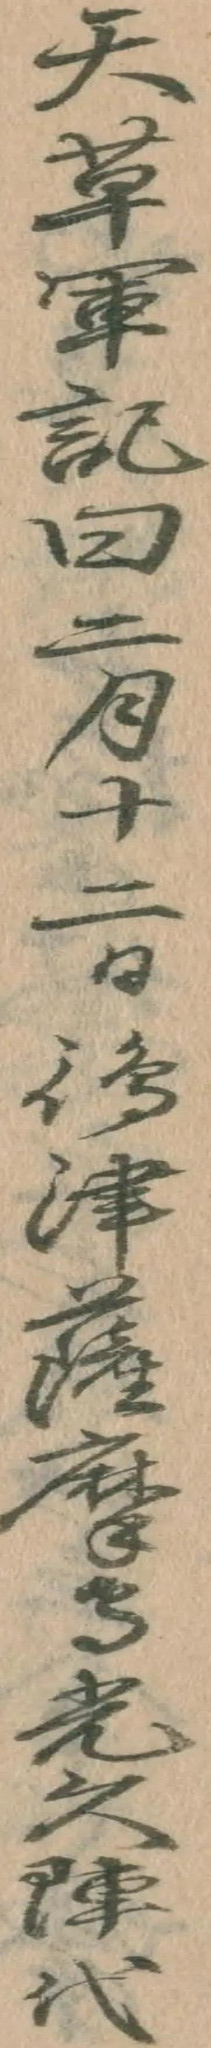天草軍記曰二月十二日島津薩摩守光久陣代
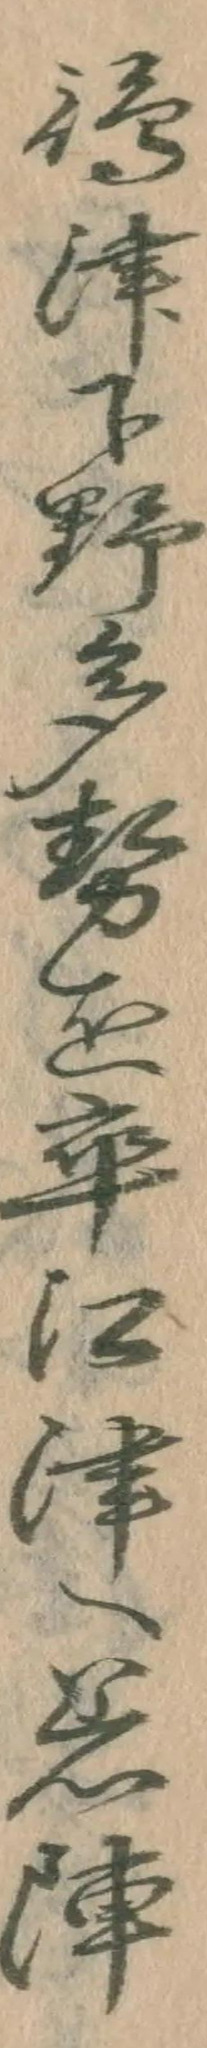島津下野多勢懸卒江津へ着陣
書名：切支丹御退治記 49巻. [6]
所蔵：国立国会図書館 National Diet Library, JAPAN
